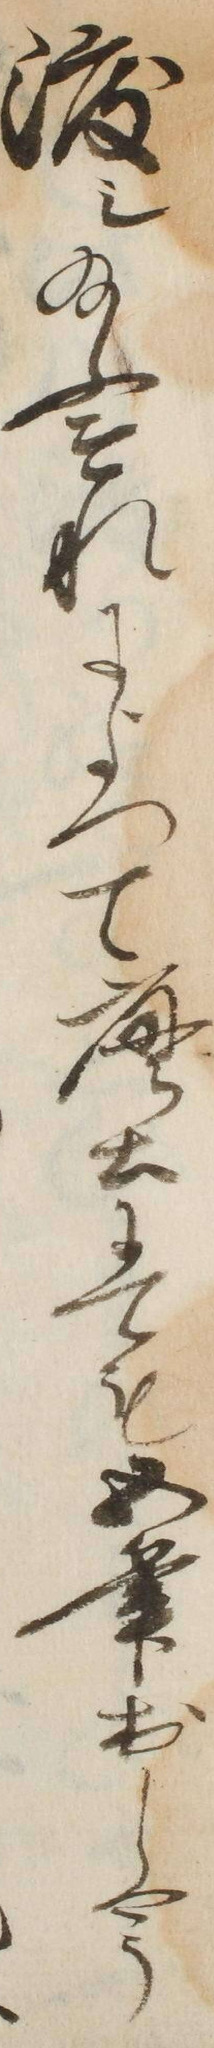渡し給ふそれによつて唐土にても五筆おしやう
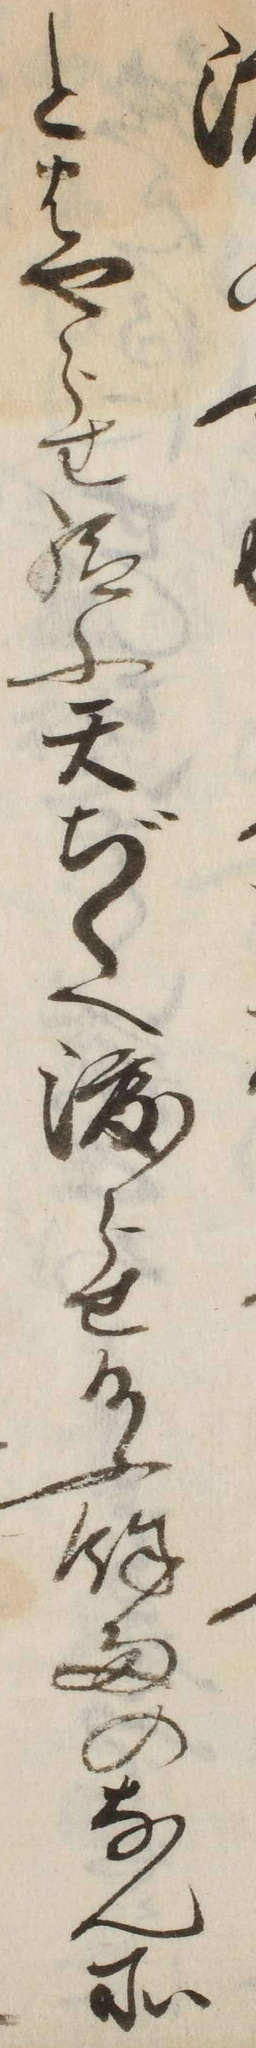とはやらせ給ふ天ぢくへ渡らせ給ふ降？雨のなん所
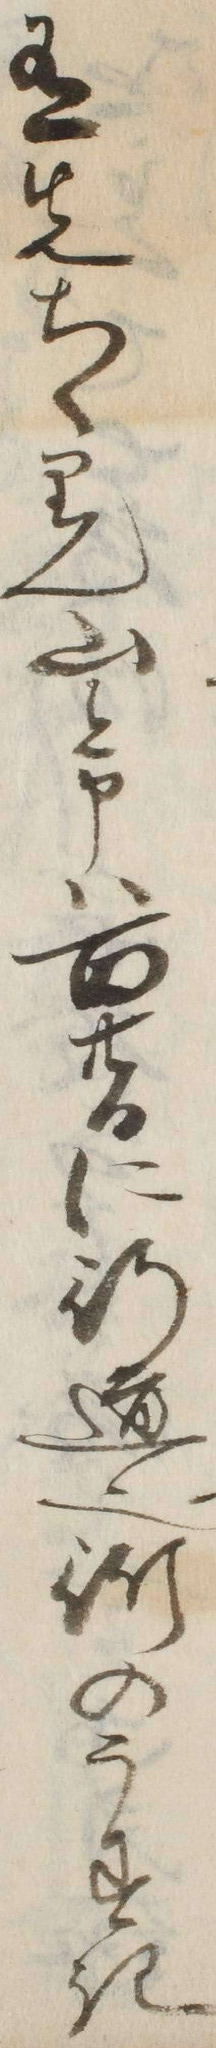有先ちくりん山と申は百廿日に行道也竹？のうすき
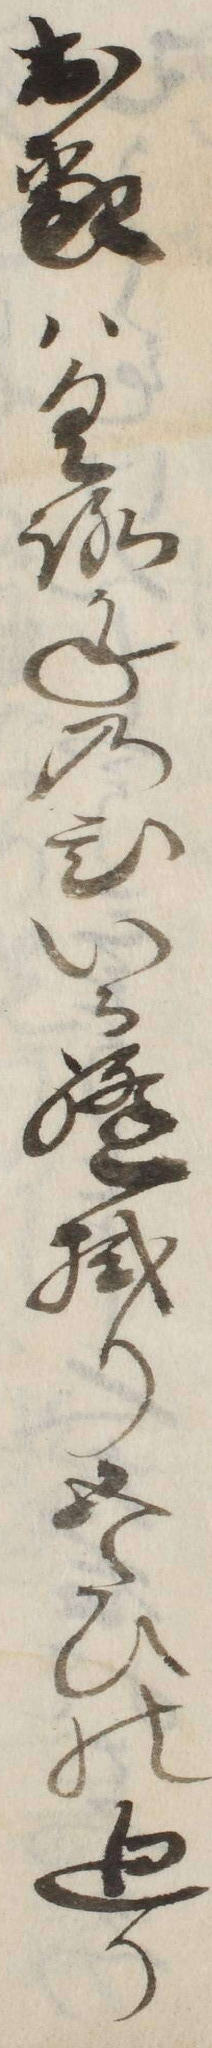出す？はくろねのひいか継？掛り五たひの廻り？
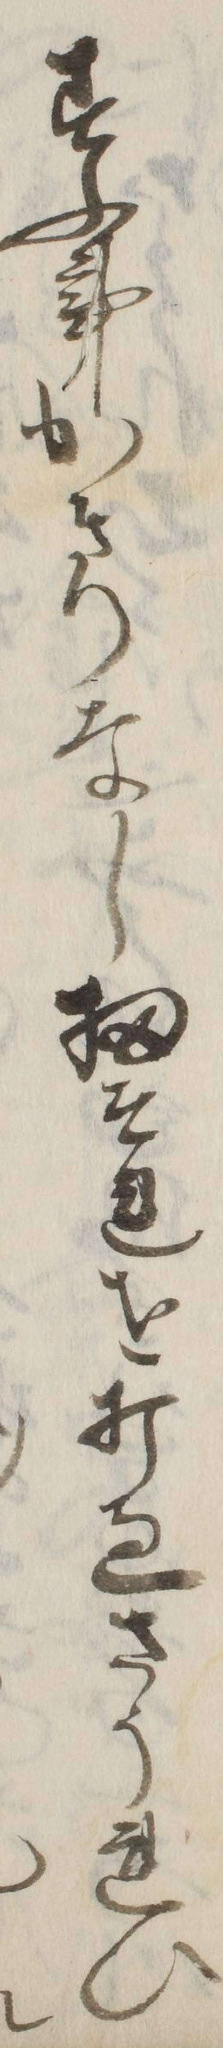すふ事かきりなし扨それを打過さうれひ
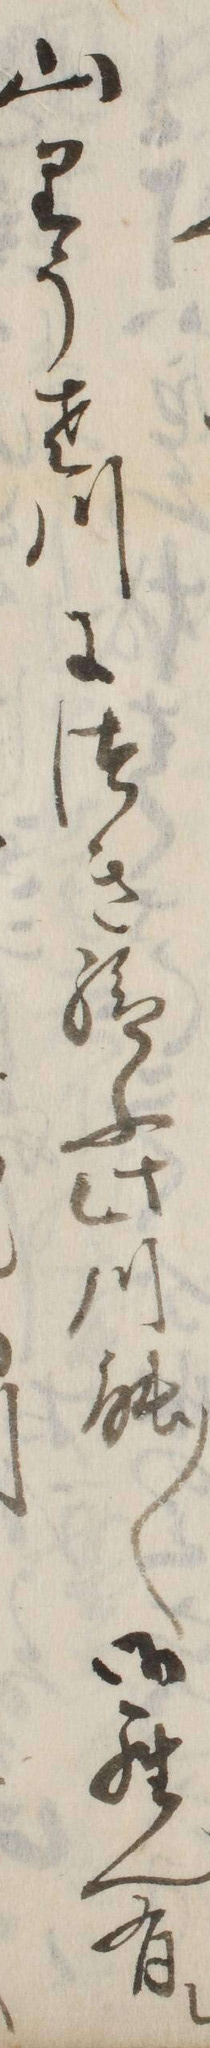山りうせ川につき給ふ此川帳能〳〵御らん有れ
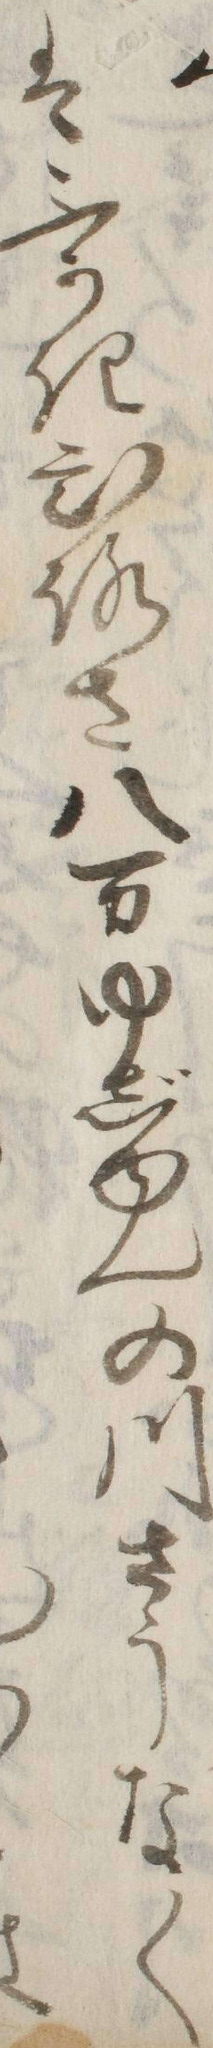はふかきひろさ八万ゆじゆんの川さうな〳〵
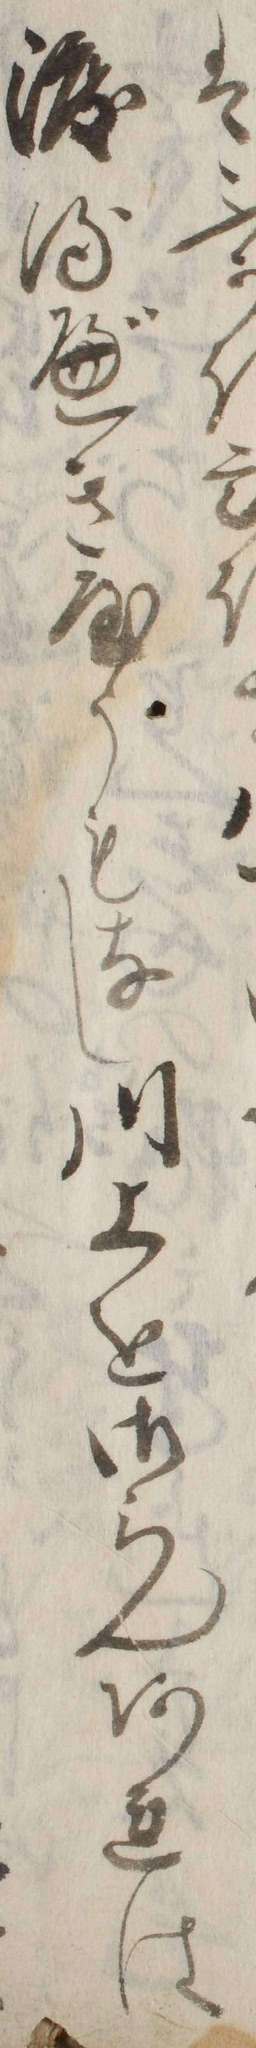一渡るべきほうもなし川上を御らんあれは
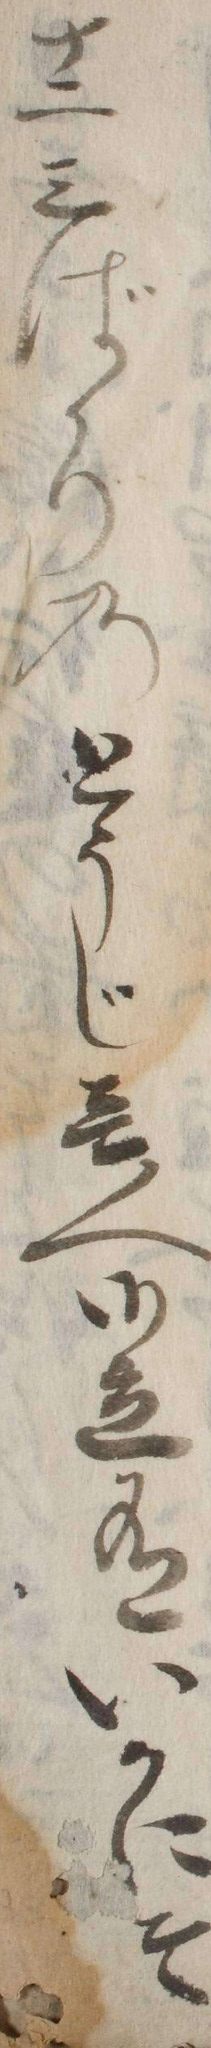十二三ばかりのとうじ壱人御立有いかにそ

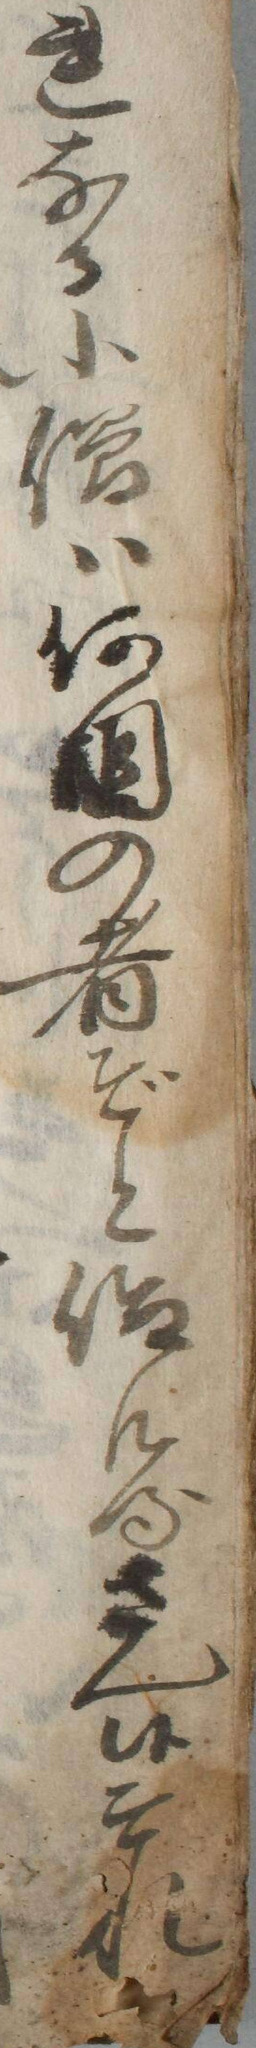れなる小僧は何国の者ぞと仰けるさん候それ
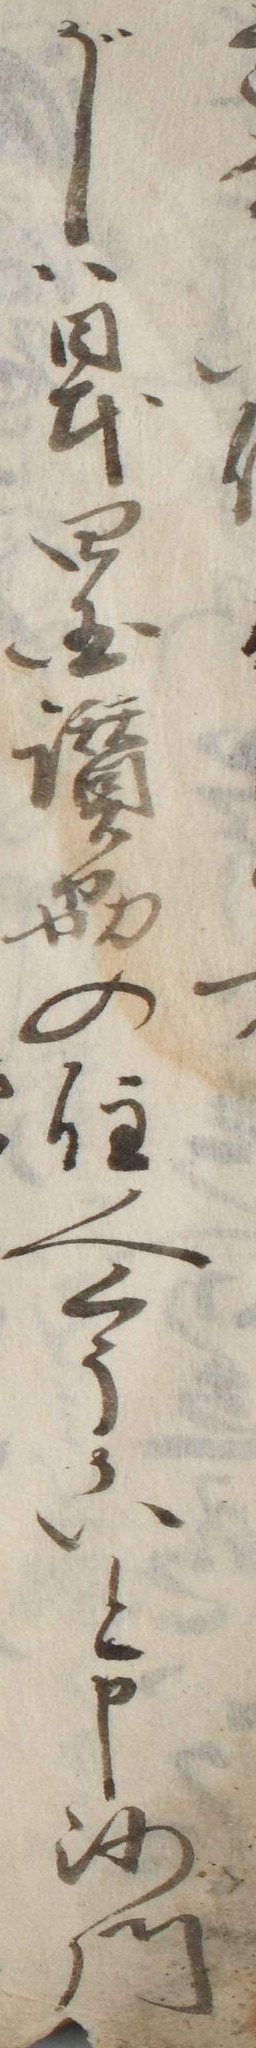がしは日本四国讃州の住人くうかいと申沙門
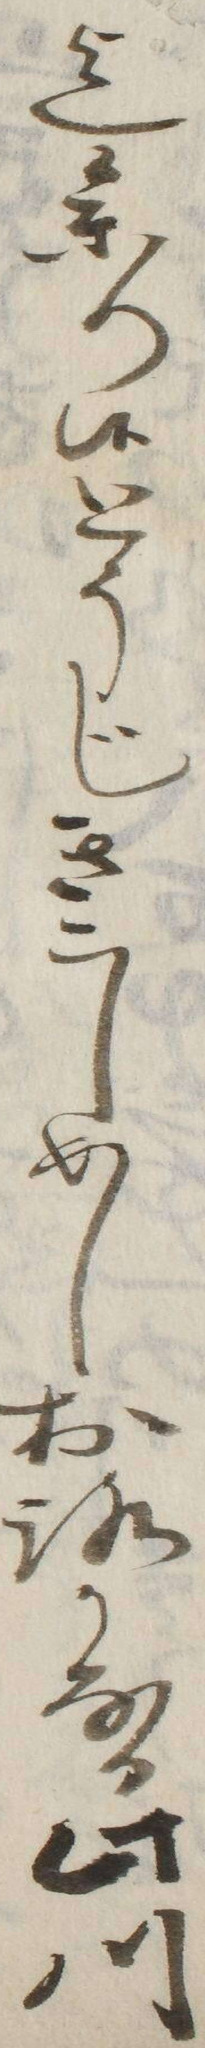迄参り候とうじきこしめしおろかなる此川
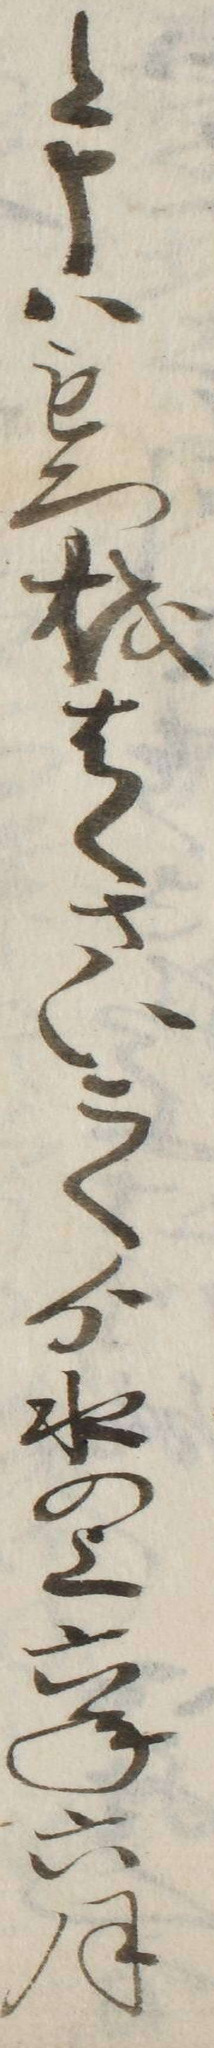と申はもろ越はくさいこくより水の上六年六月
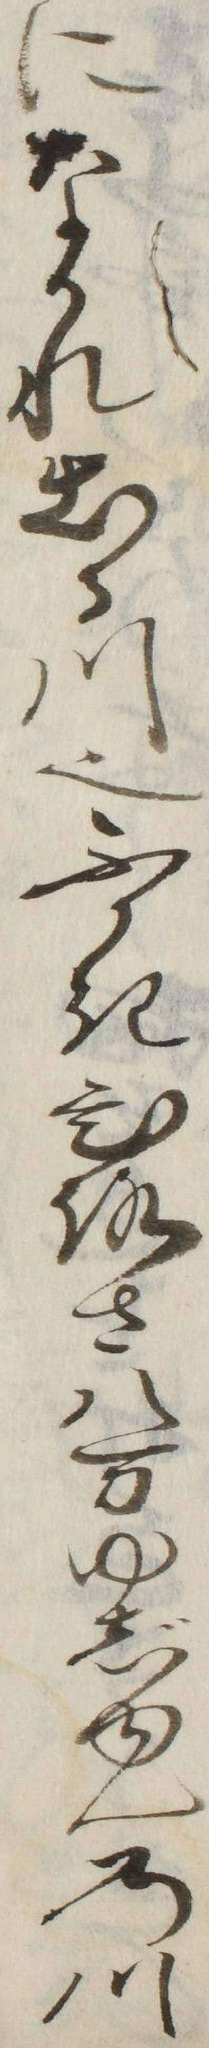になかれ出る川也ふかきひろさ八万ゆしゆんの川
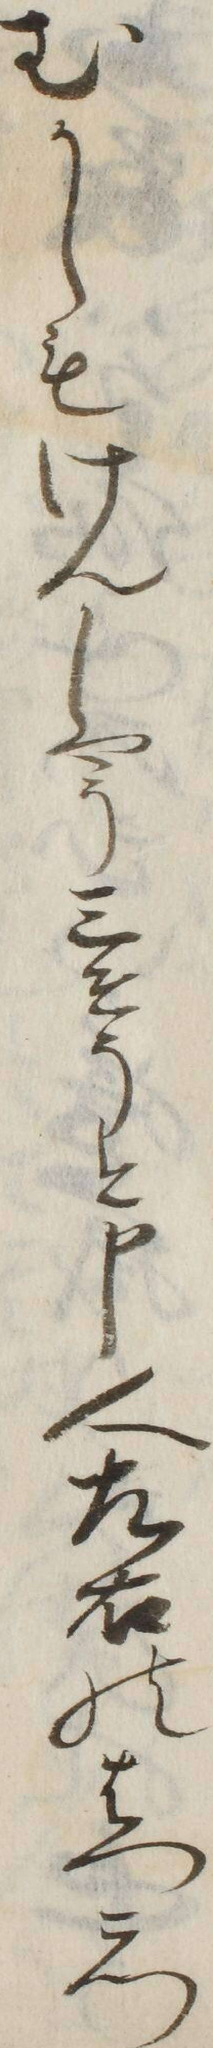むかしもけんしやう三そうと申人左右のはつこつ
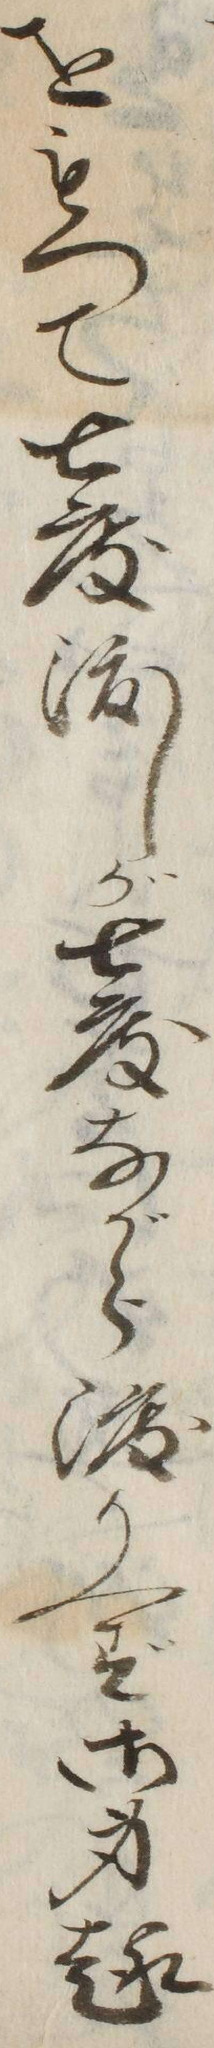をもつて七度渡しか七度ながら渡りへず御身趣
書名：奉弘法大師御傳記
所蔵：国文学研究資料館
